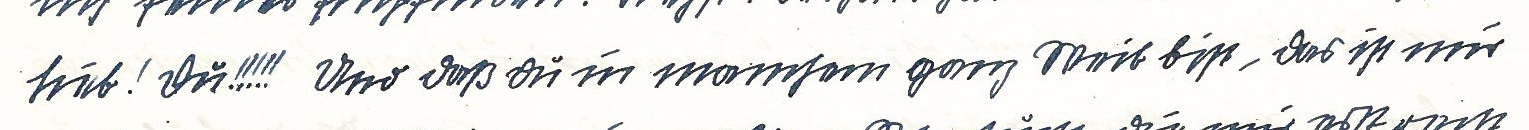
lieb! Du!!!!! Und daß Du in manchem ganz Weib bist, das ist mir
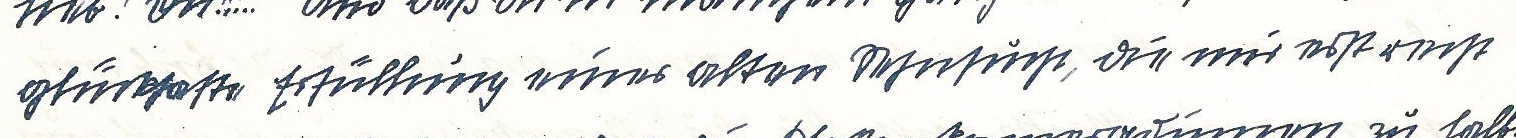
glückhafte Erfüllung einer alten Sehnsucht, die mir erst recht
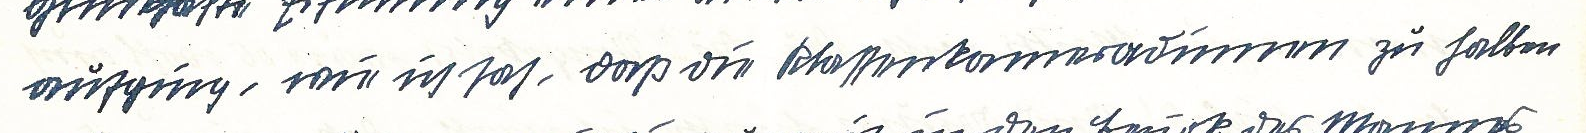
aufging, wie ich sah, daß die Klassenkameradinnen zu halben
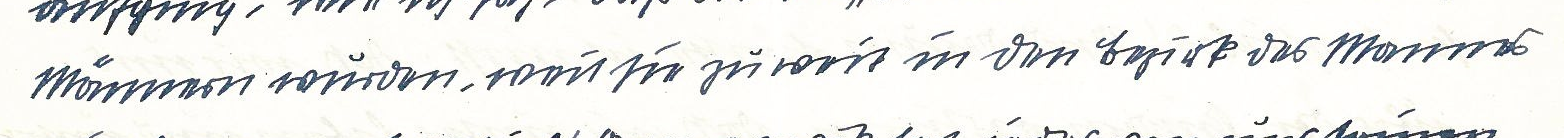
Männern wurden, weil sie zu weit in den Bezirk des Mannes
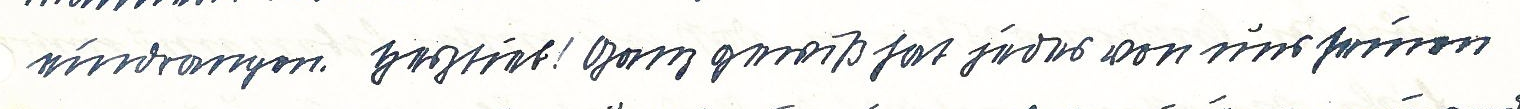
eindrangen. Herzlieb! Ganz gewiß hat jeder von uns seinen
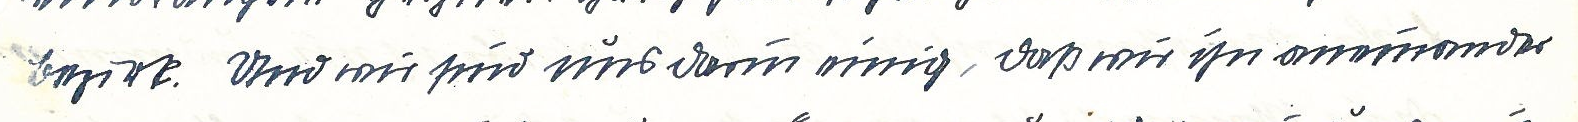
Bezirk. Und wir sind uns darin einig, daß wir ihn aneinander
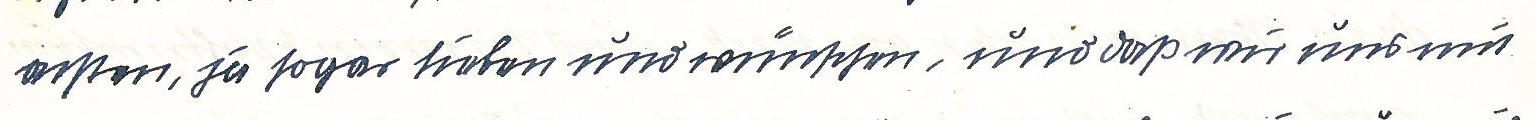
achten, ja sogar lieben und wünschen, und daß wir uns mit
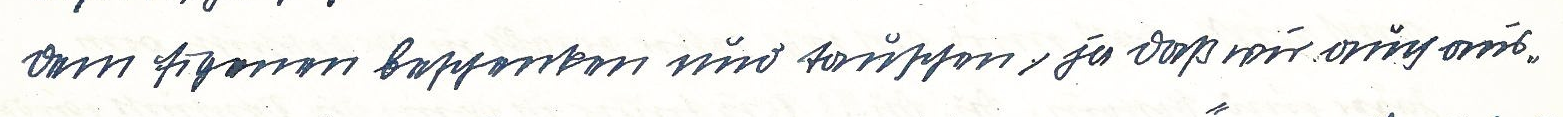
dem Eigenen beschenken und tauschen, ja daß wir auch aus¬
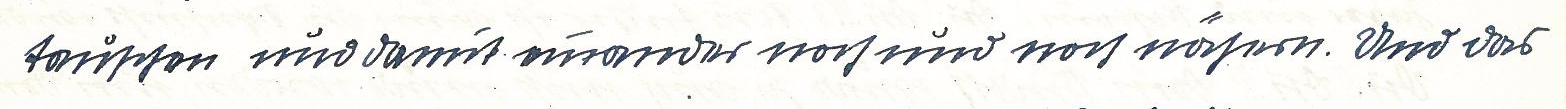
tauschen und damit einander noch und noch nähern. Und das
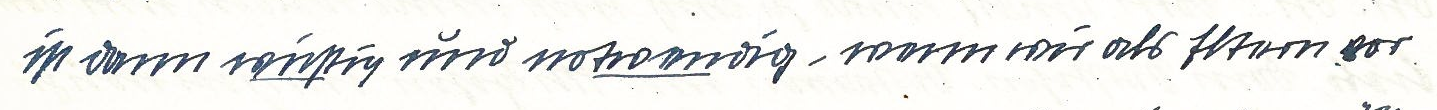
ist dann wichtig und notwendig, wenn wir als Eltern vor
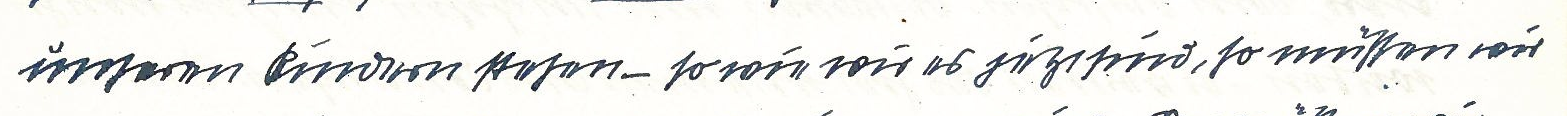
unseren Kindern stehen – so wie wir es jetzt sind, so müssen wir
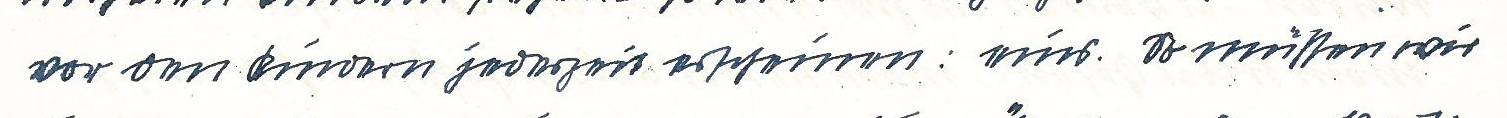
vor den Kindern jederzeit erscheinen: eins. So müssen wir
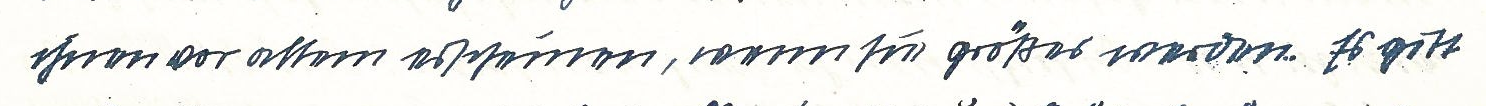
ihnen vor allem erscheinen, wenn sie größer werden. Es gibt
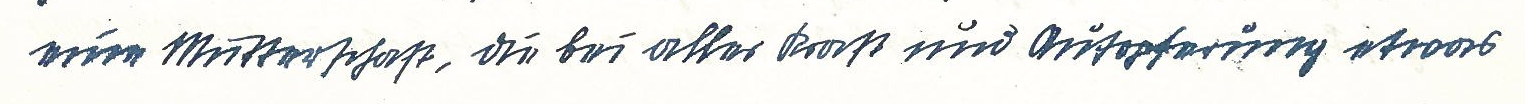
eine Mutterschaft, die bei aller Kraft und Aufopferung etwas
